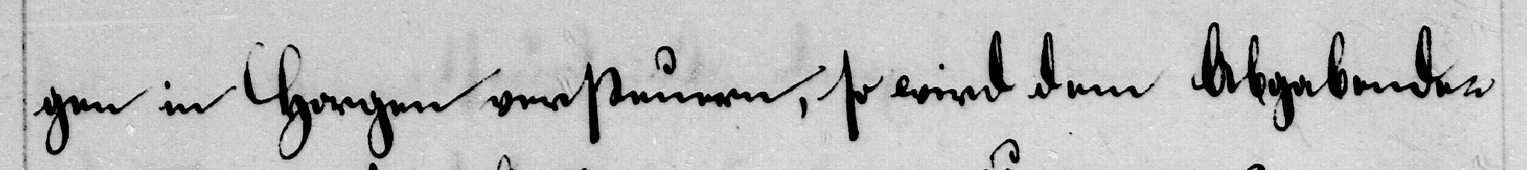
gen in Horgen versteuern, so wird dem Abgabende¬
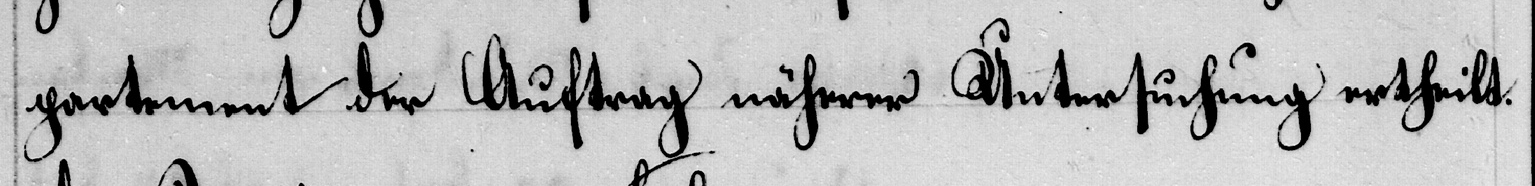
partement der Auftrag näherer Untersuchung ertheilt.
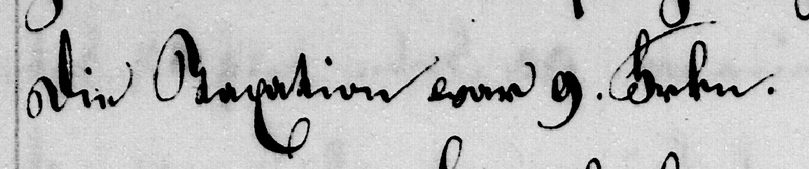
Die Taxation war 9. Frkn.
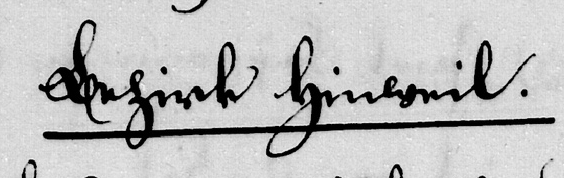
Bezirk Hinweil.
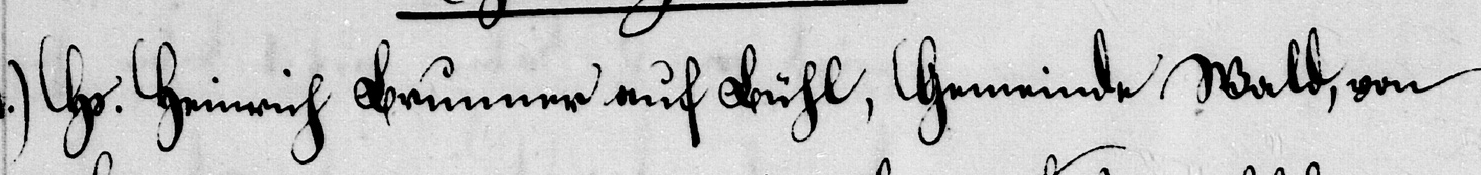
Hs. Heinrich Brunner auf Bühl, Gemeinde Wald, von
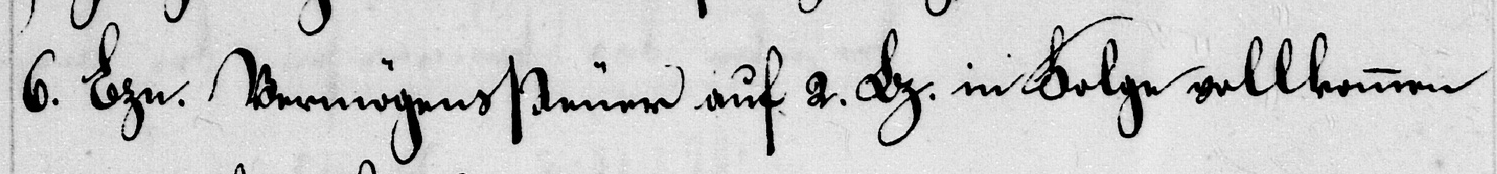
6. Bzn. Vermögenssteuer auf 2. Bz. in Folge vollkommen
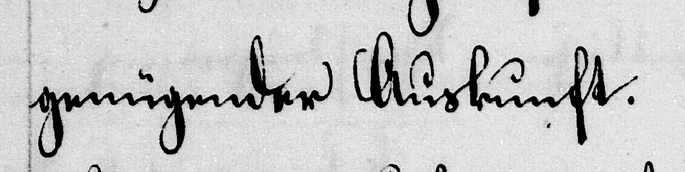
genügender Auskunft.
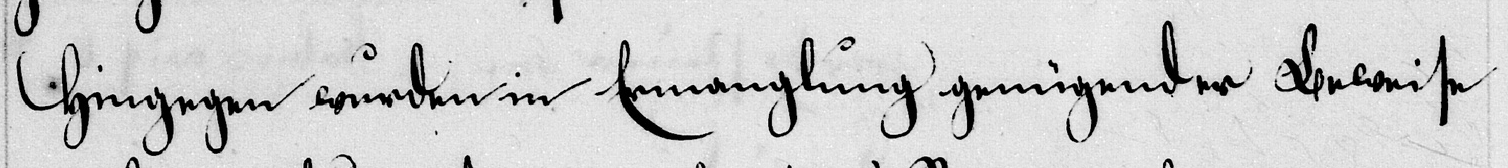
Hingegen wurden in Ermanglung genügender Beweise
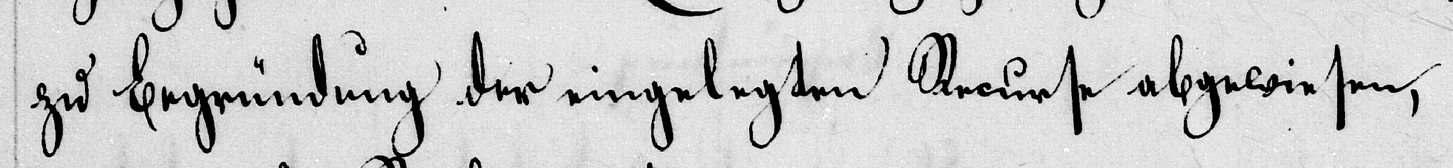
zu Begründung der eingelegten Recurse abgewiesen,
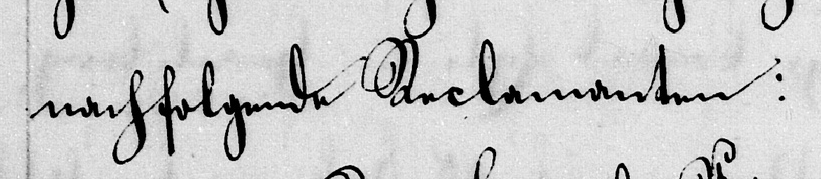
nachfolgende Reclamanten:
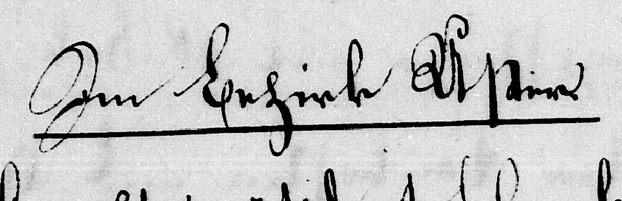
Im Bezirk Uster.
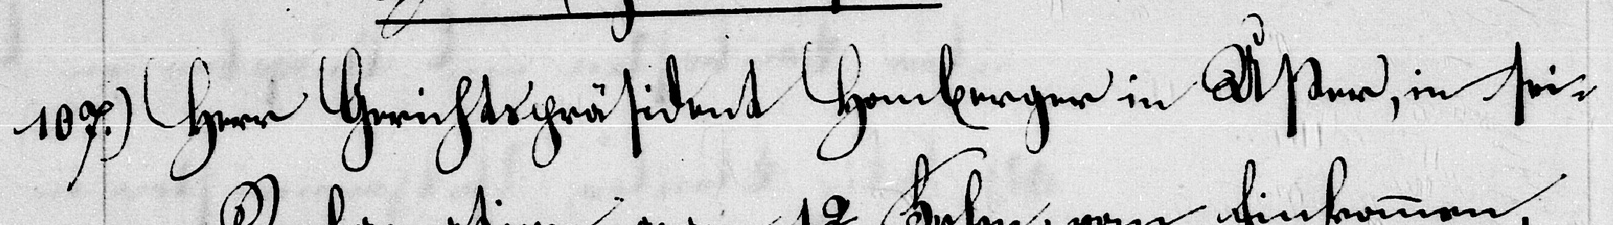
107.) Herr Gerichtspräsident Homberger in Uster, in sei¬
